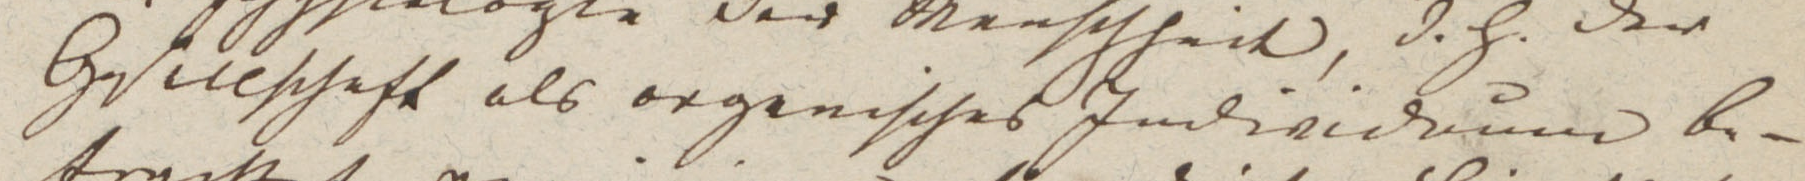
Gesellschaft als organisches Individuum be-
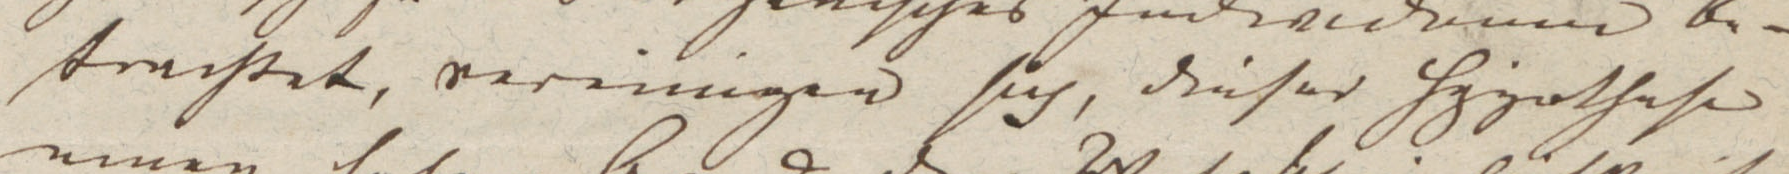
trachtet, vereinigen sich, dieser Hypothese
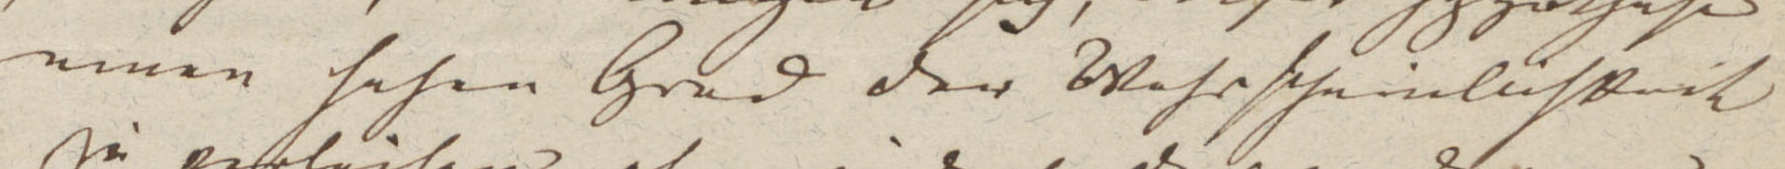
einen hohen Grad der Wahrscheinlichkeit
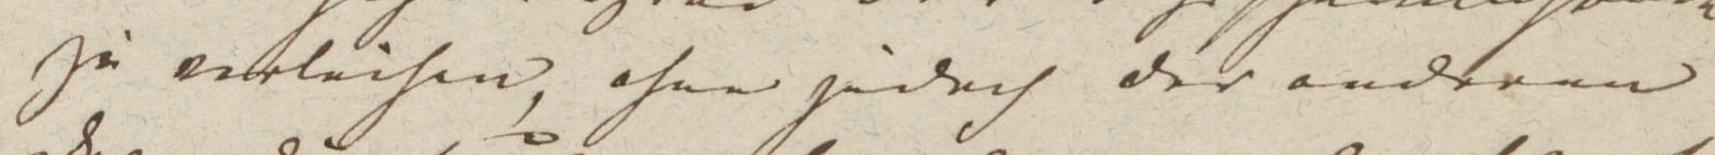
zu verleihen, ohne jedoch der anderen
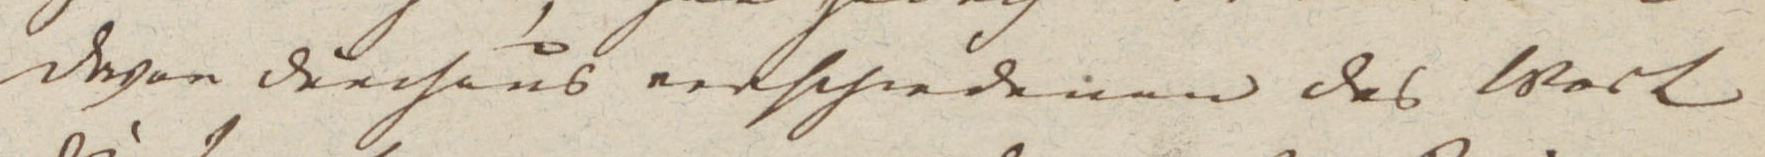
davon durchaus verschiedenen das Wort
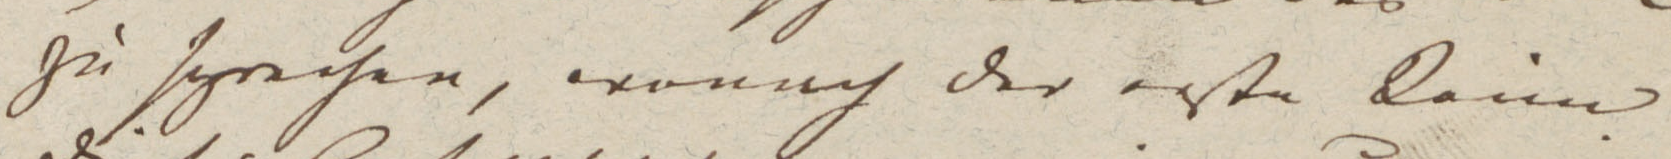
zu sprechen, wonach der erste Keim
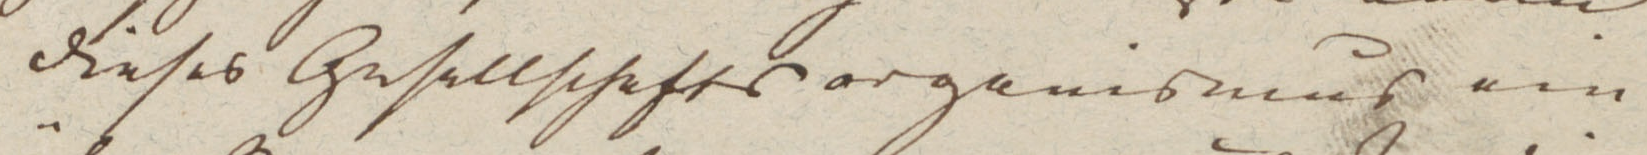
dieses Gesellschaftsorganismus ein
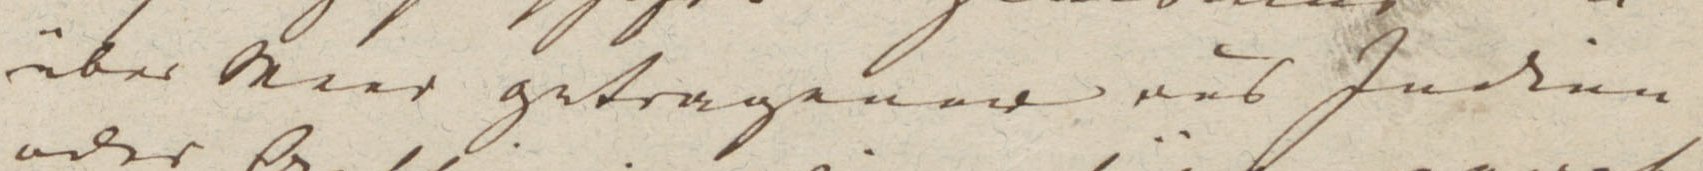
über Meer getragener aus Indien
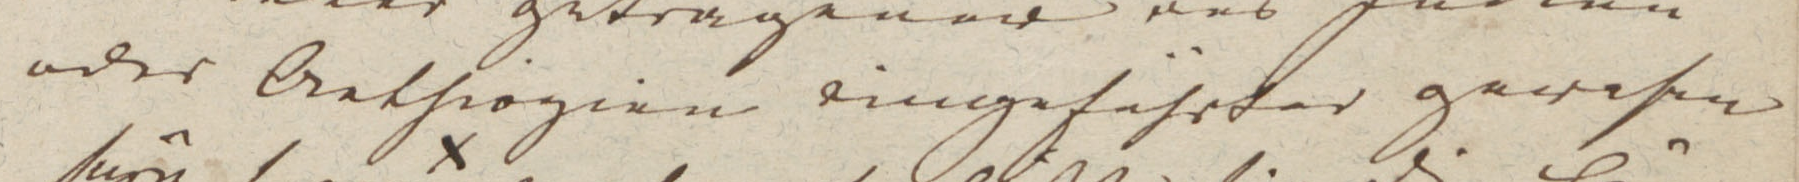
oder Aethiopien eingeführter gewesen
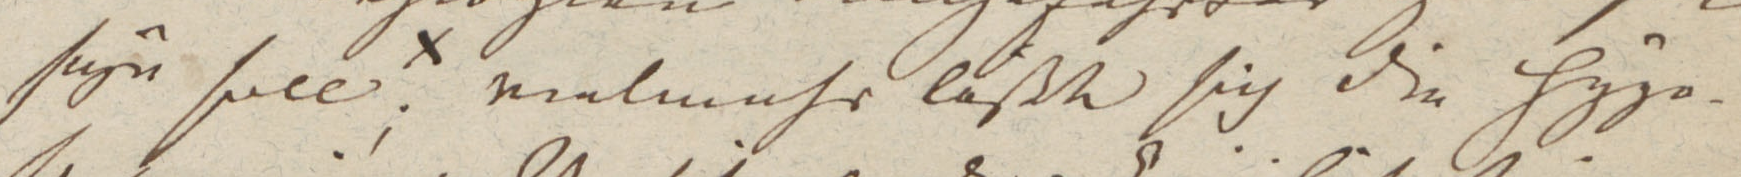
seyn soll; % vielmehr lässt sich die Hypo-
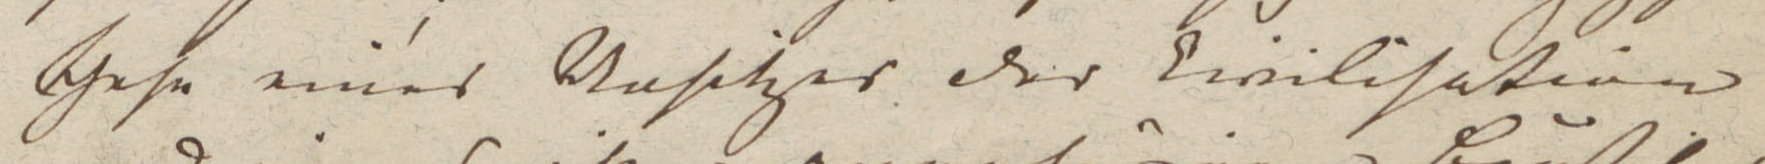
these eines Ursitzes der Civilisation
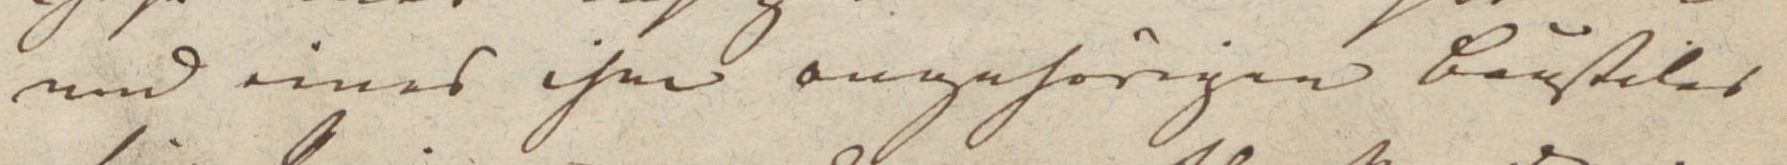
und eines ihm angehörigen Baustiles
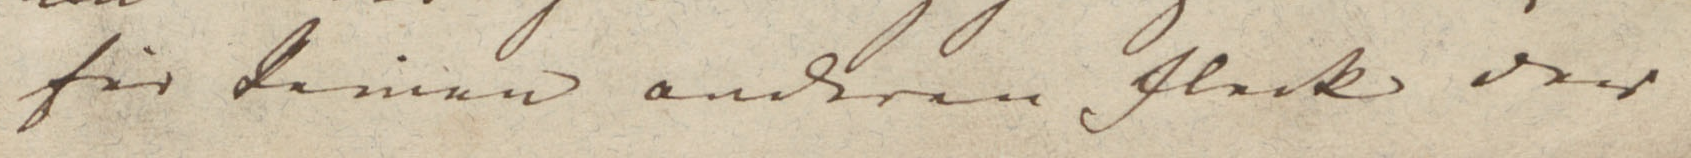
für keinen anderen Fleck der
